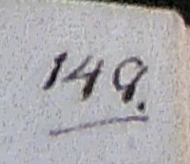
149.
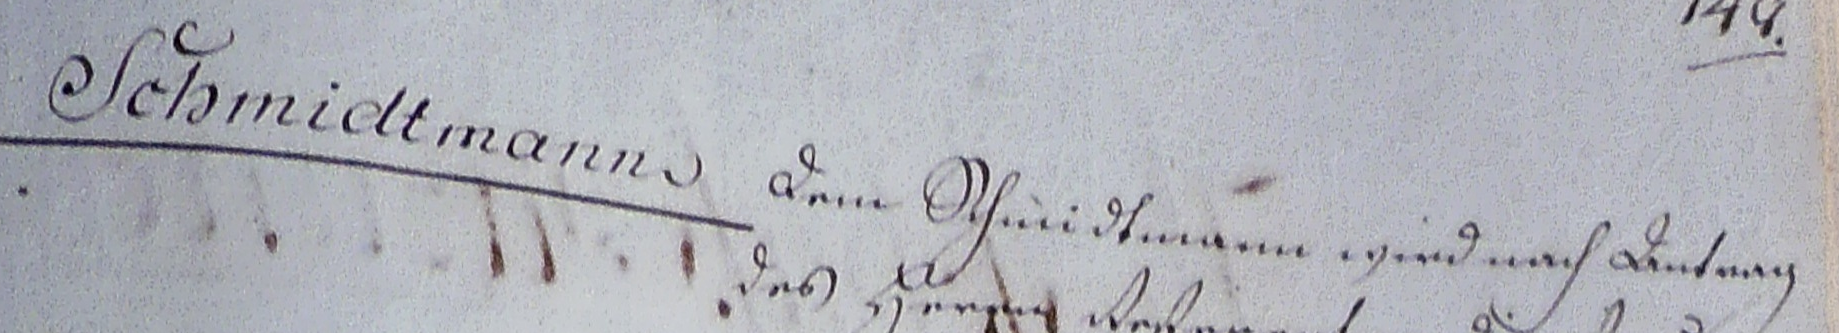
Schmidtmann Dem Schmidtmann wird nach Antrag
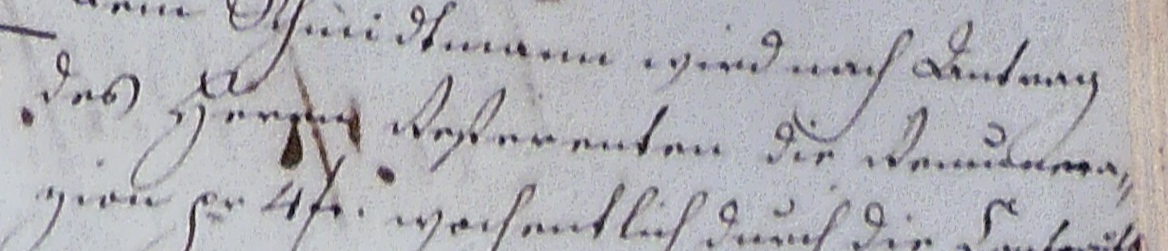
des Herrn Referenten die Remunera¬
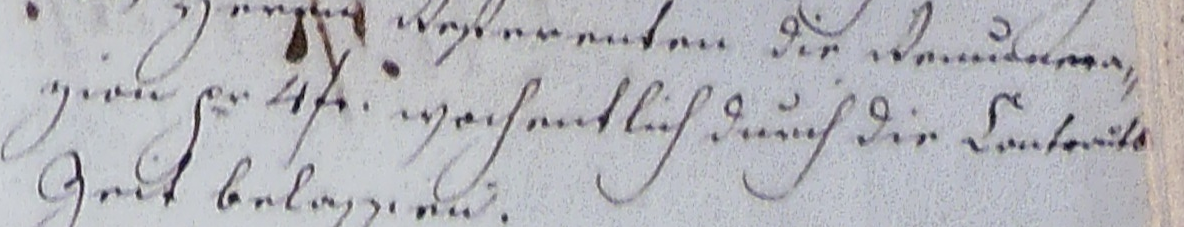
zion pr͇ 4fr. wochentlich durch die Contracts
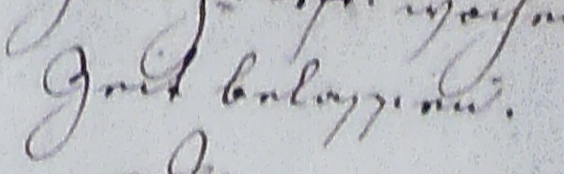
Zeit belassen.
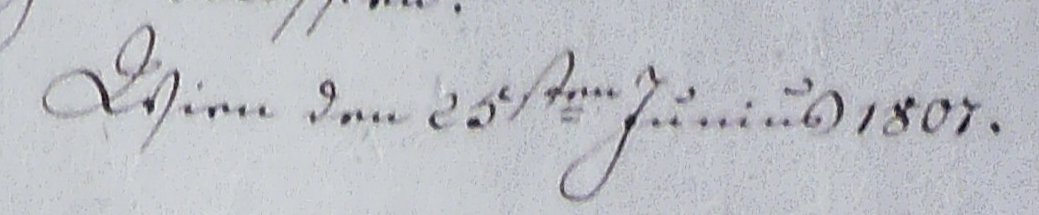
Wien den 25ste͇n Junius 1807.
